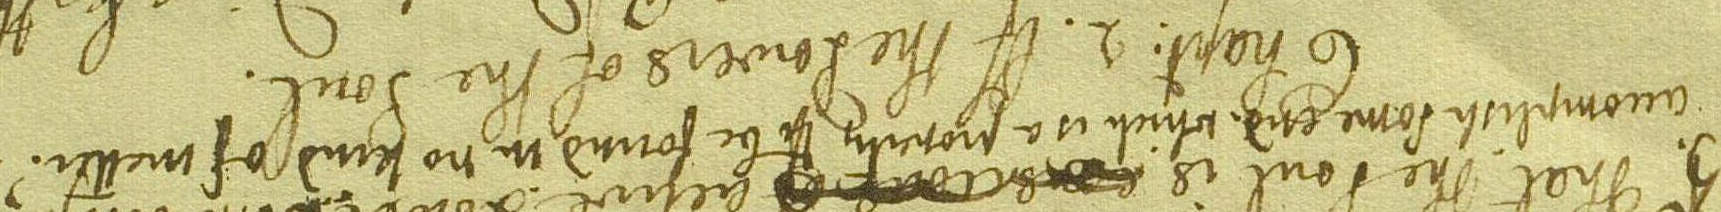accomplish some end which is a property to be found in no kind of matter.-
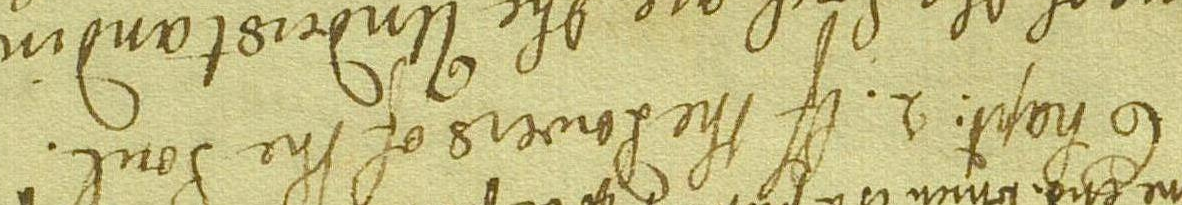Chapt: 2. Of the Powers of the Soul.
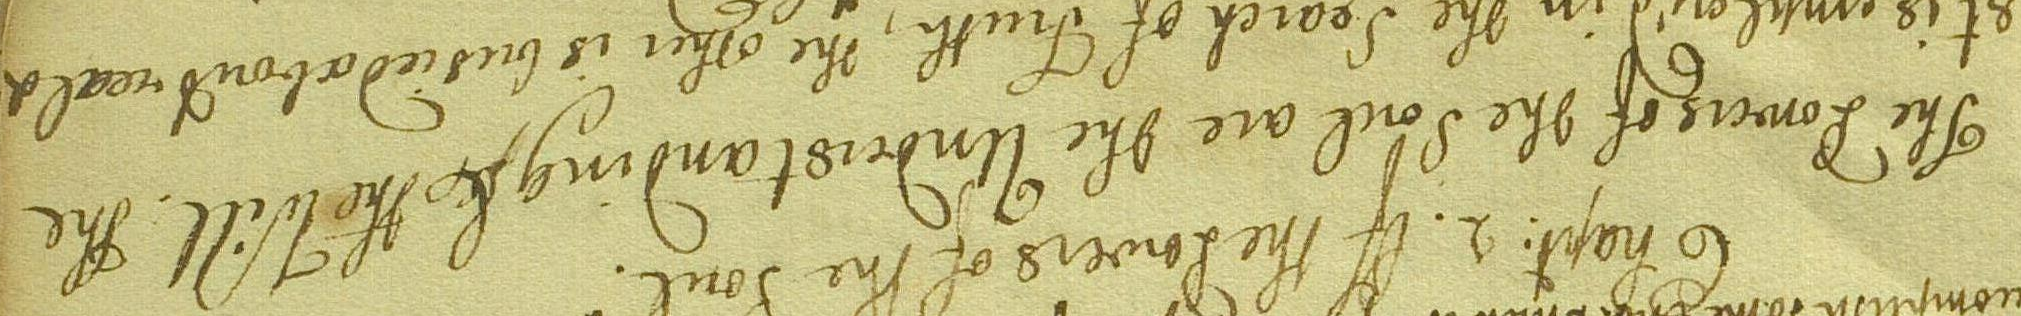The Powers of the Soul are the Understanding & the Will. The
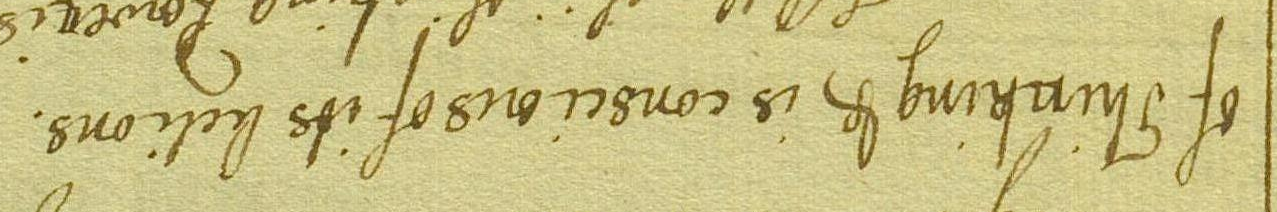Of Thinking & is conscious of its Actions.
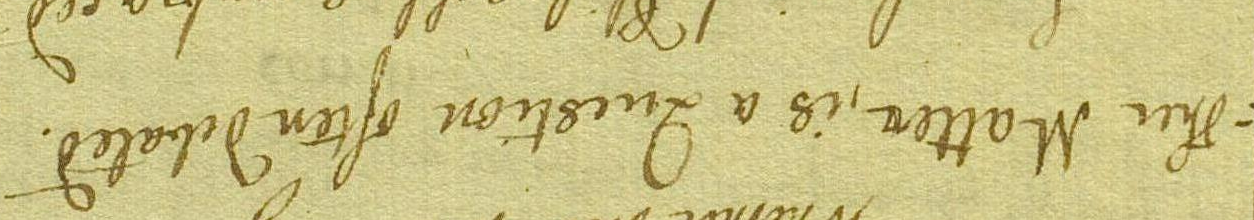-ther Matter, is a Question often debated.
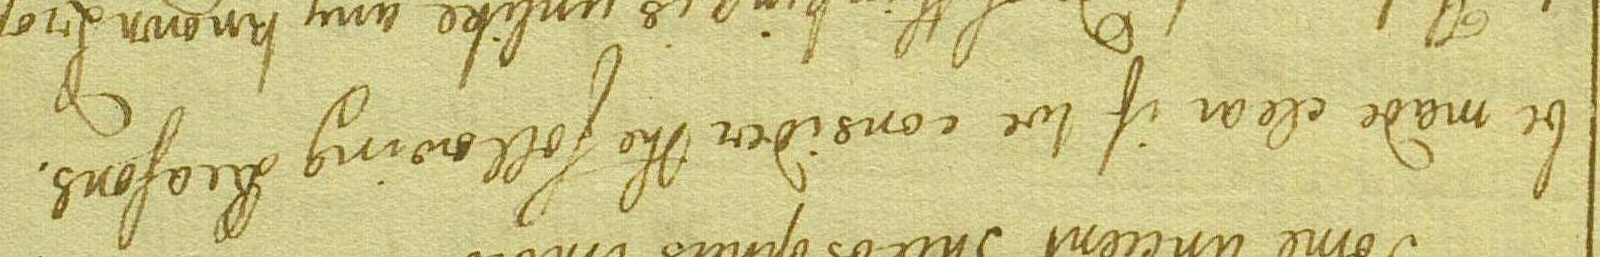be made clear if we consider the following Reasons.
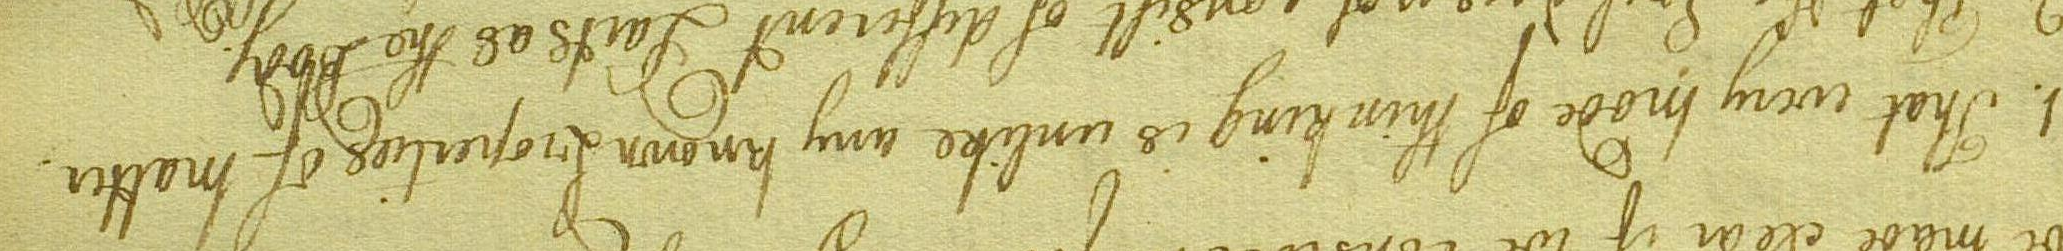1. That every mode of thinking is unlike any known Properties of matter.
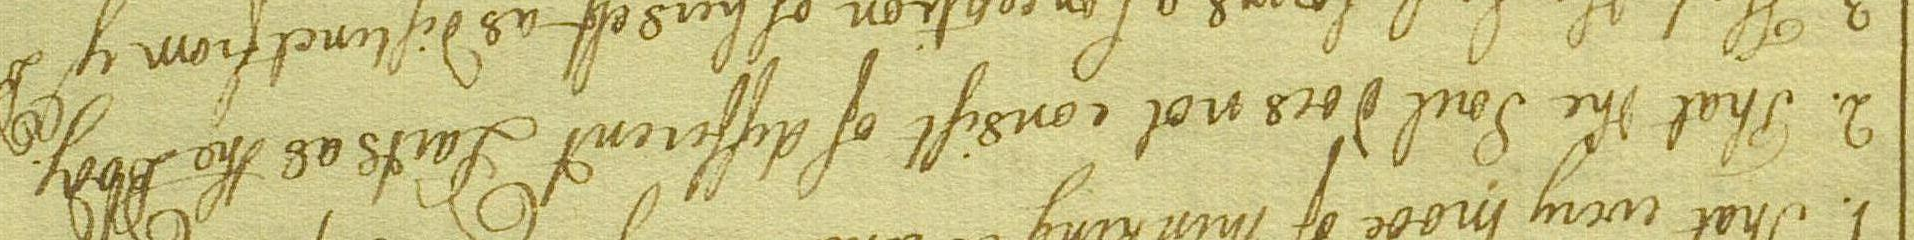2. That the Soul does not consist of different Parts as the Body.
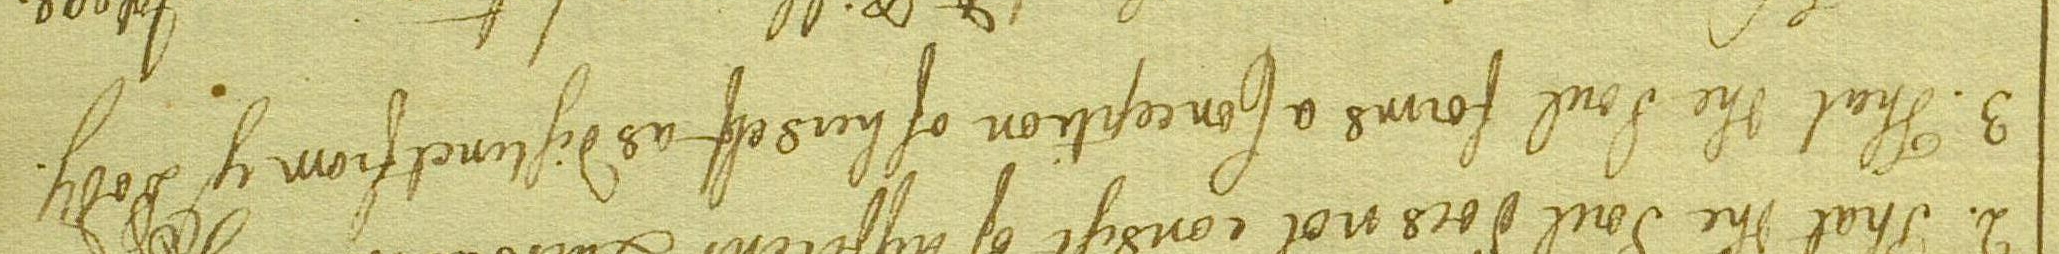3. That the Soul forms a Conception of herself as distinct from y^e Body.
